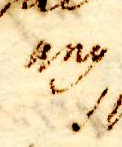any
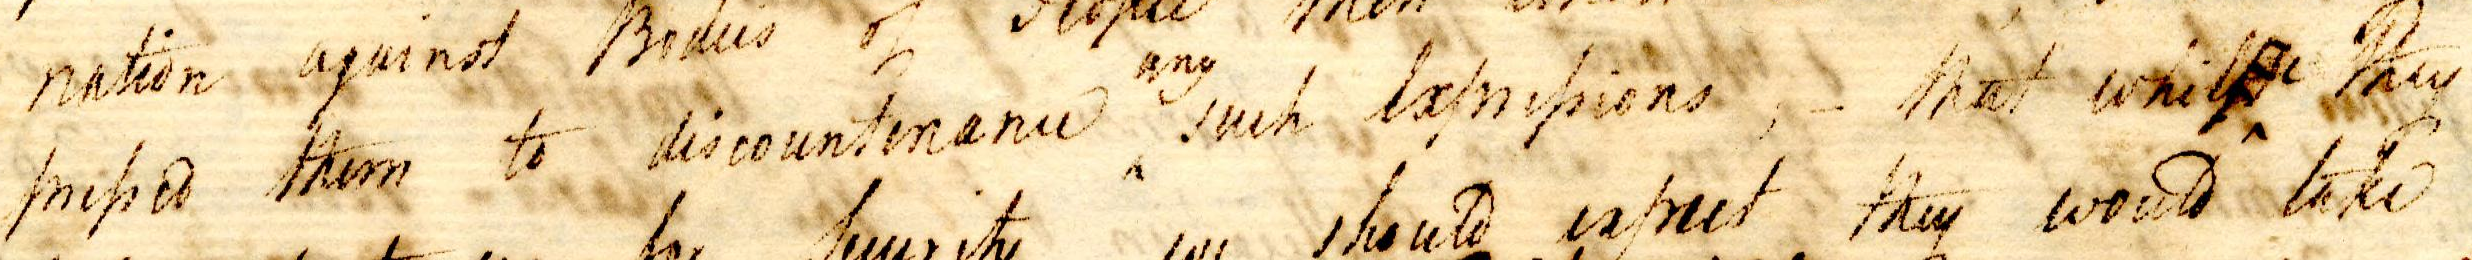pressed them to discountenance ^ such Expressions, that while they
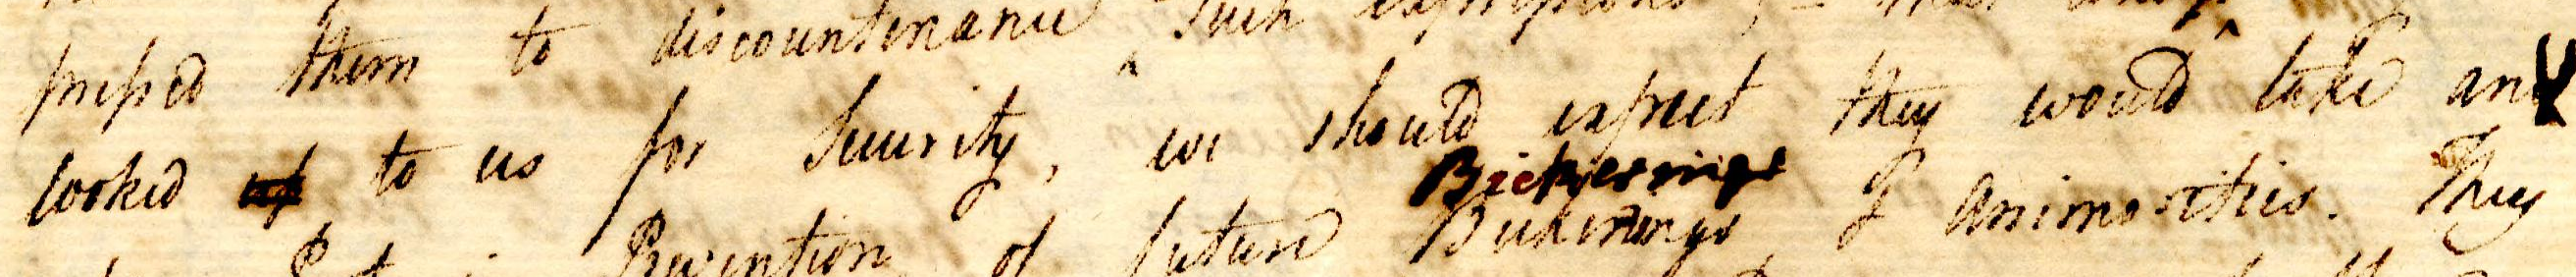looked up to us for Suerity, we should expect they would take an
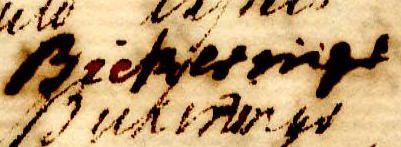Bickerings
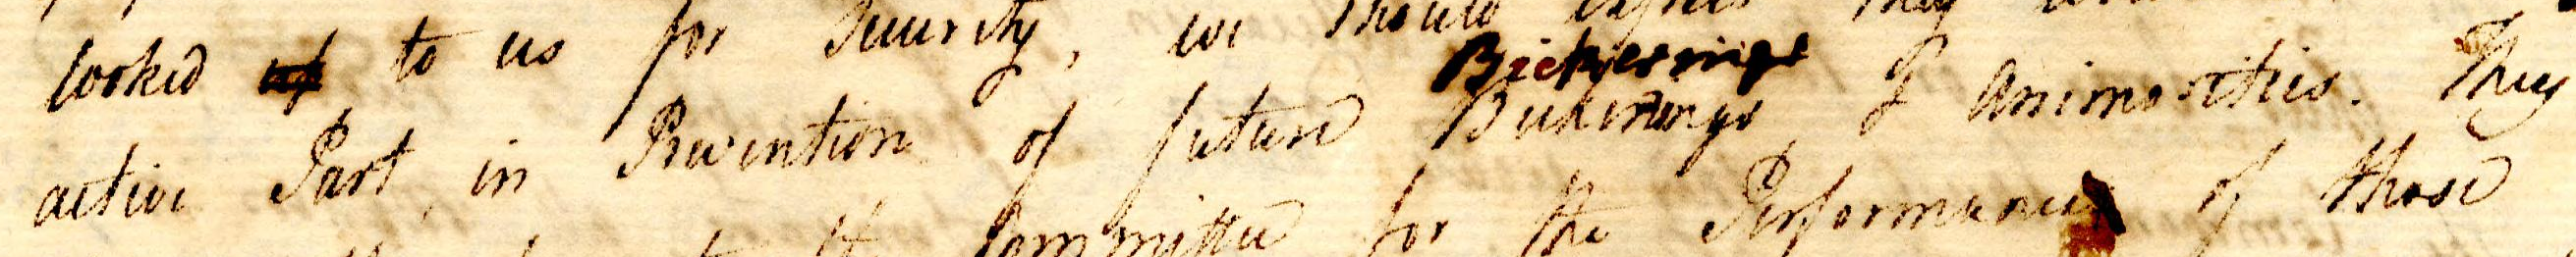active Part in Prevention of future Bickerings & Animosities. They
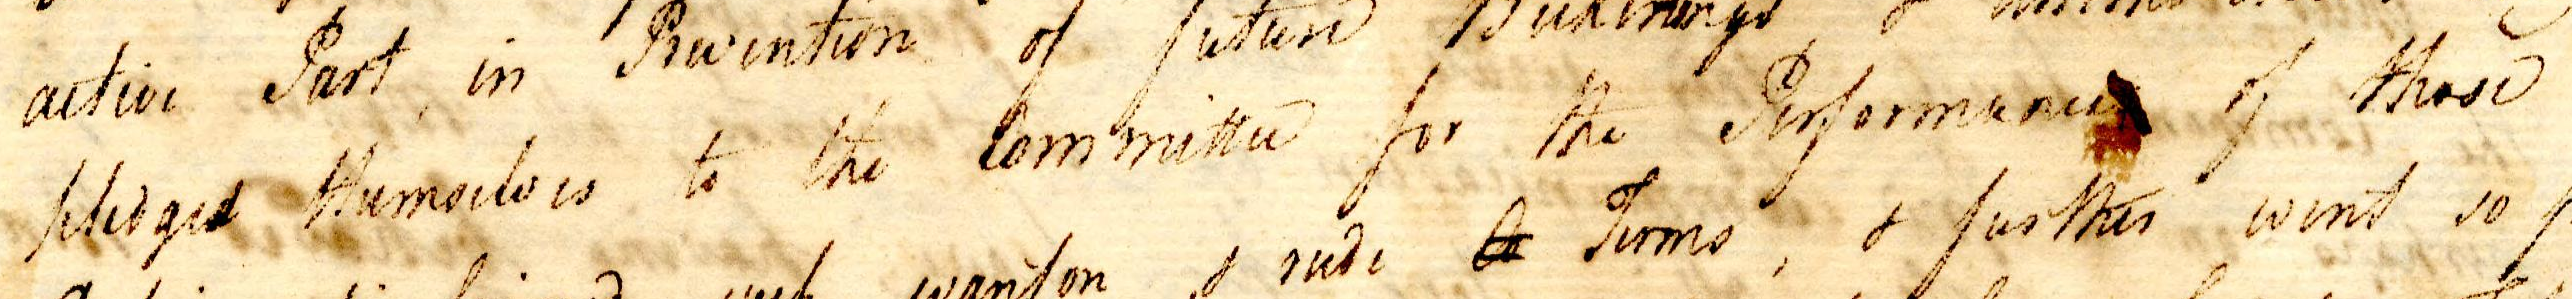pledged themselves to the Committee for the Performance of those
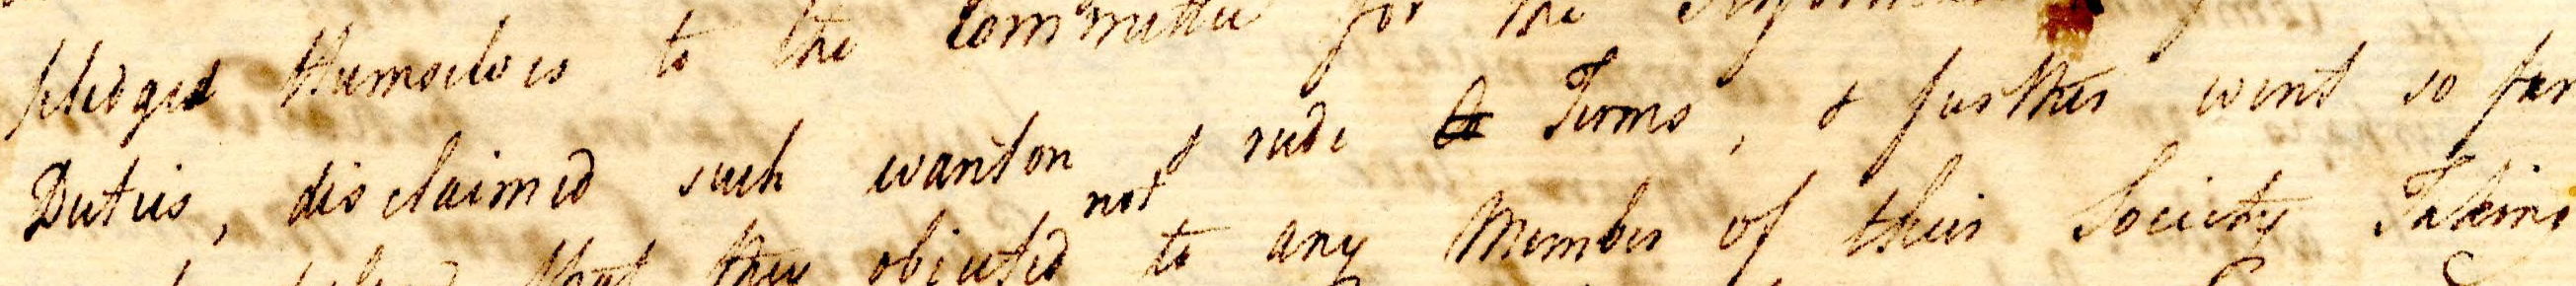Duties, disclaimed such wanton & rude A Terms, & further went so far
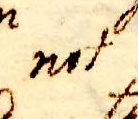not
